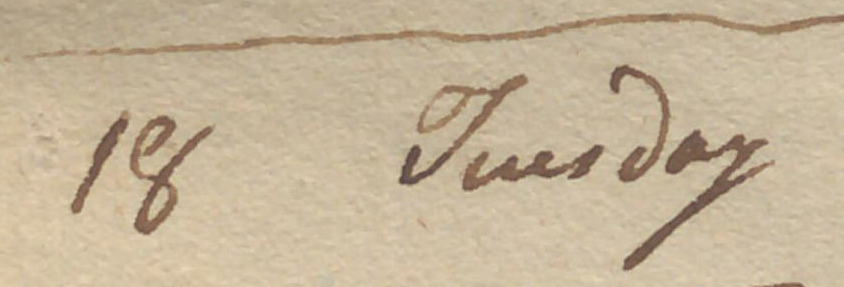18 Tuesday
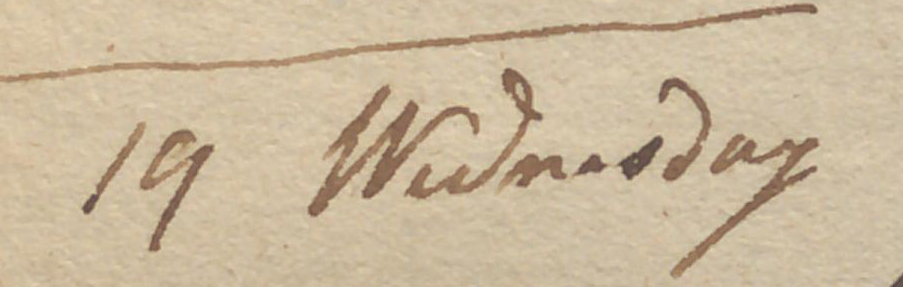19 Wednesday
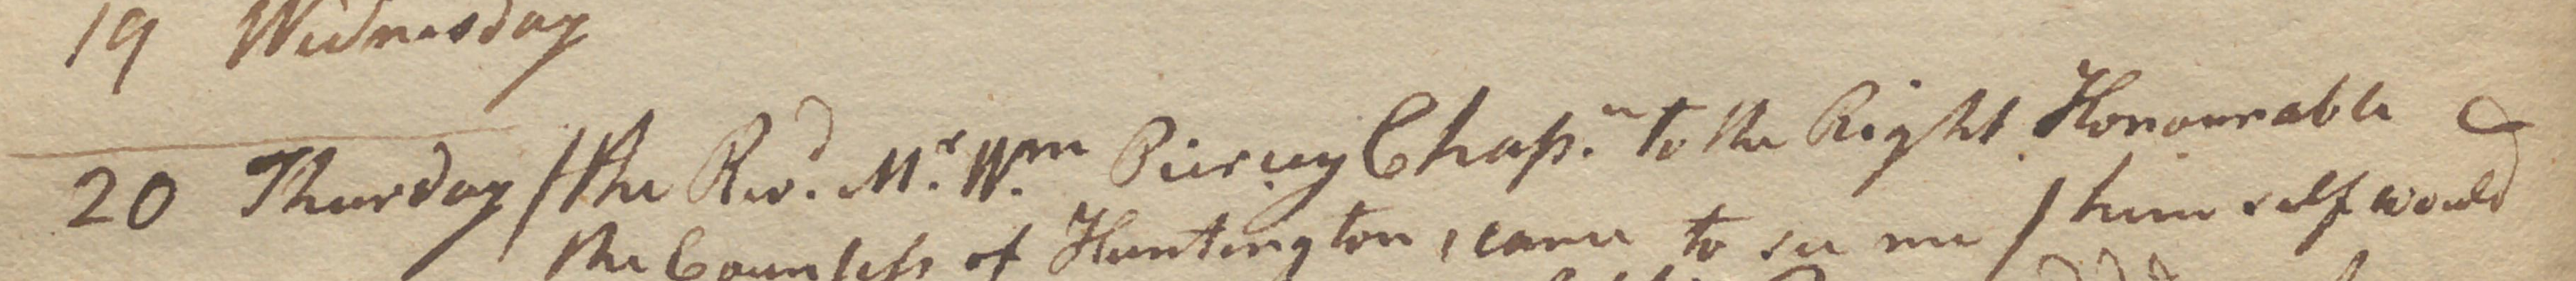20 Thurday / the Rev^d. M^r. W^m. Piercey Chap^r. to the Right Honorable
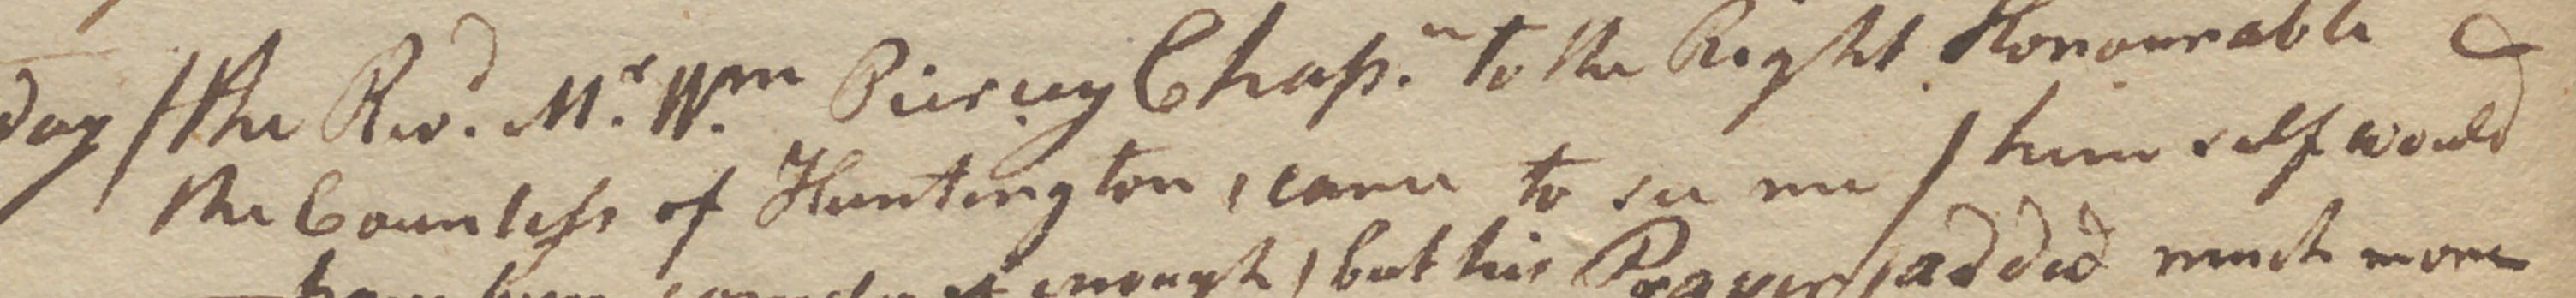the Countess of Huntington, came to see me / himself would
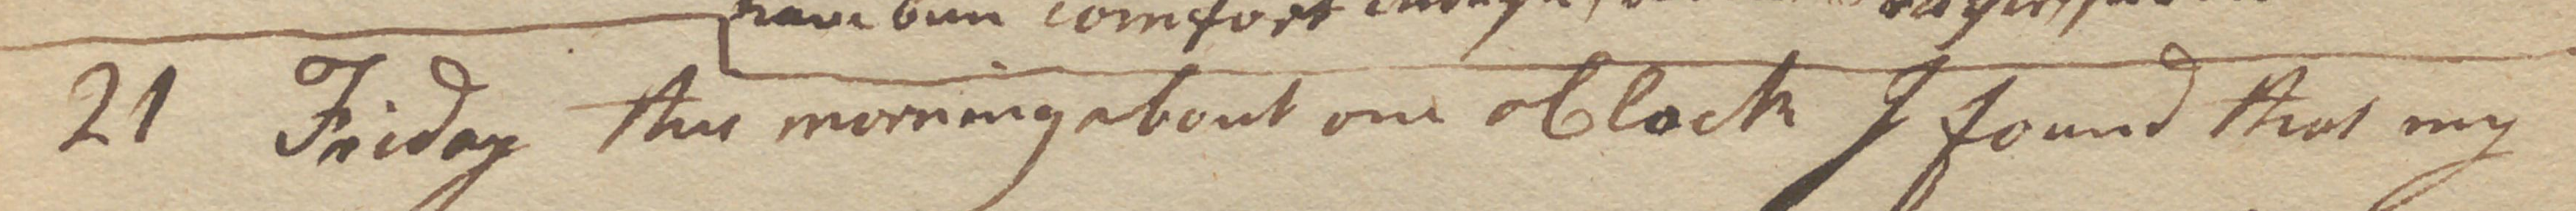21 Friday this morning about one oClock I found that my
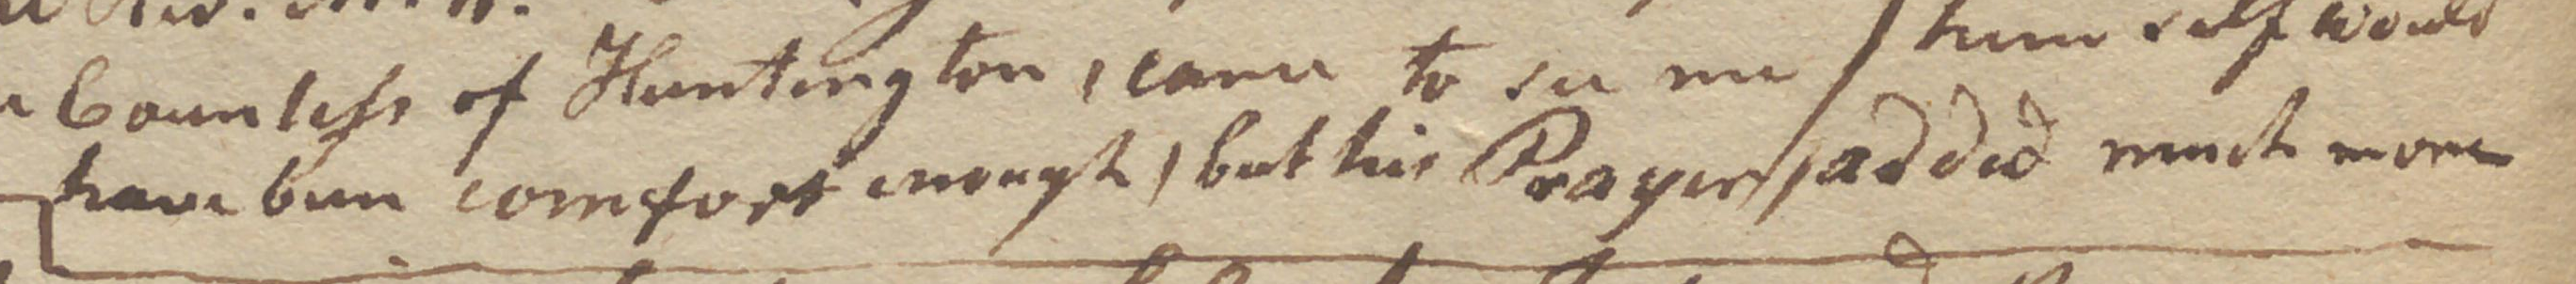have been comfort enough, but his Prayers added much more
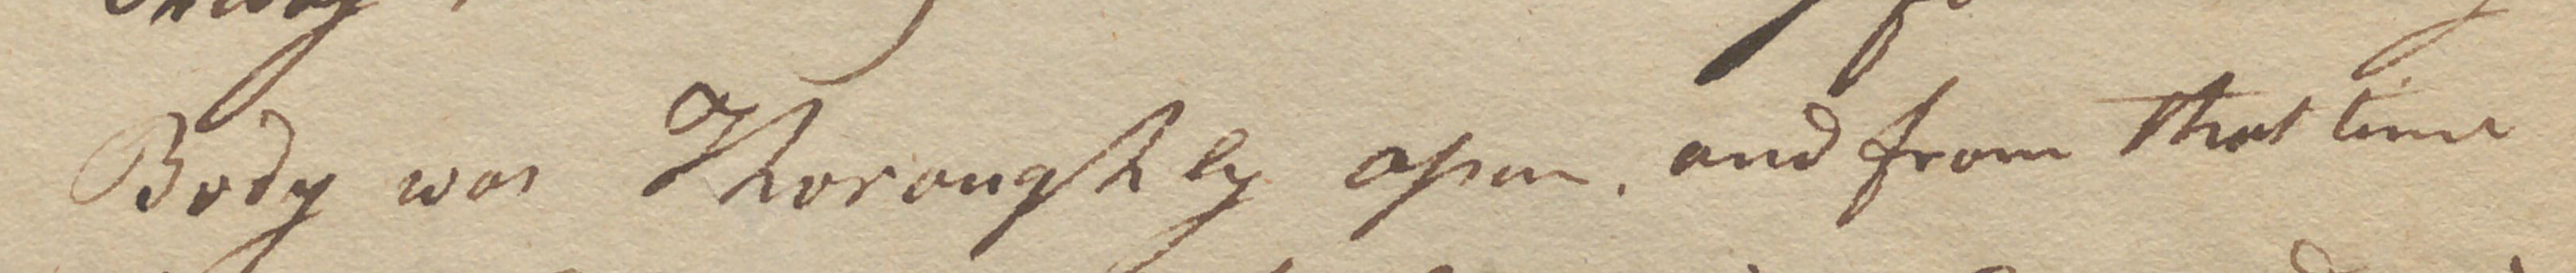Body was Thoroughly open, and from that time
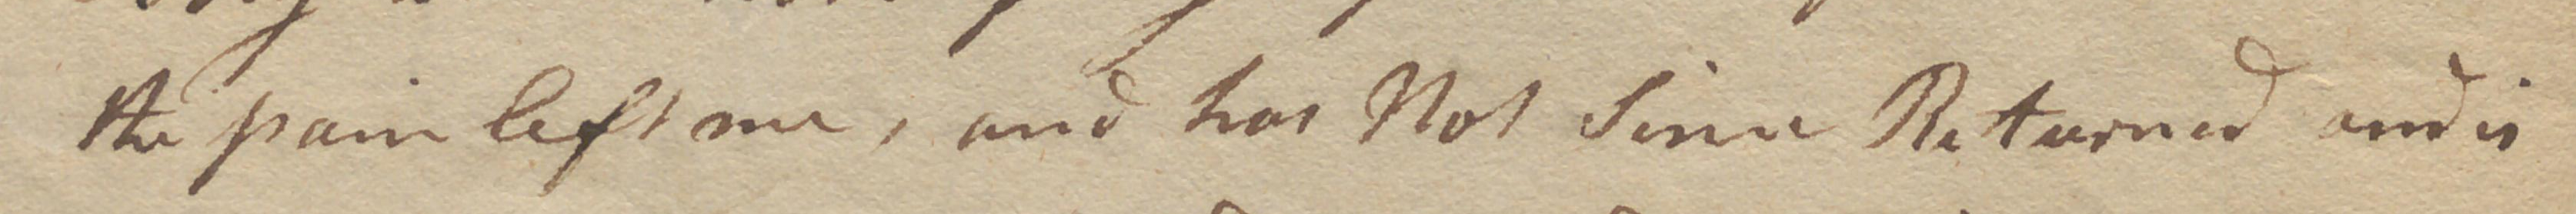the pain left me, and has Not since Returned and is
